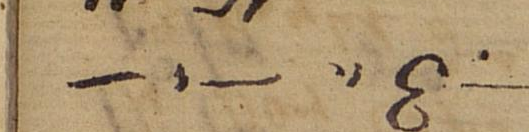-3 a--
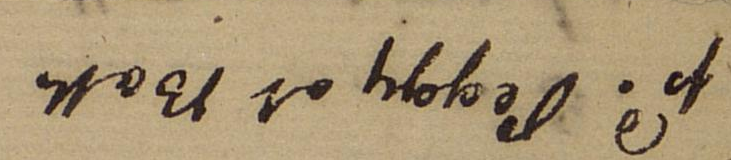n^d. Pegoy at Batl
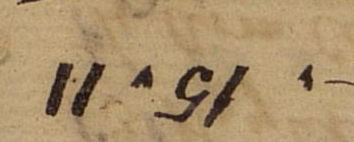515588
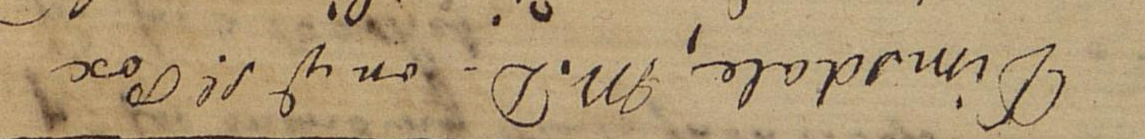Dimsdale, M. D. on y^e 1^. Pox
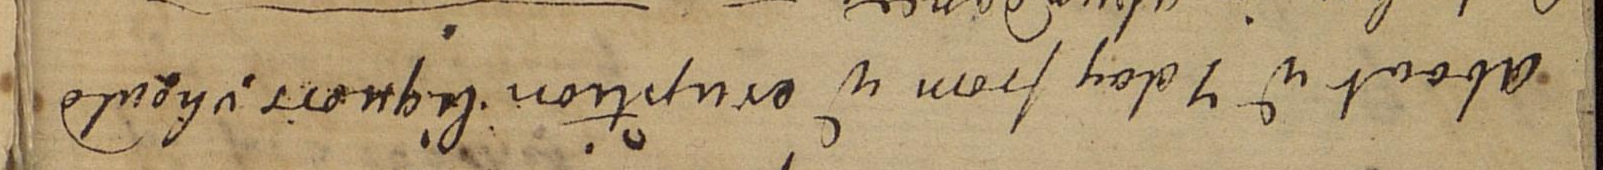about w^ 1 day from ue eruption liquors hould
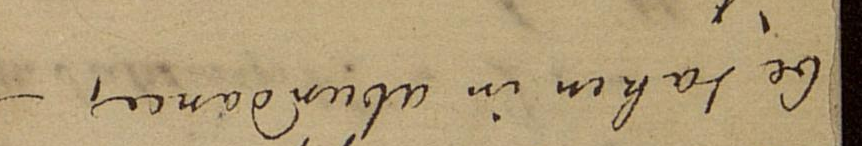be taken in abuendance,-
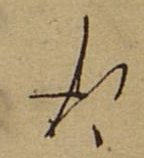1
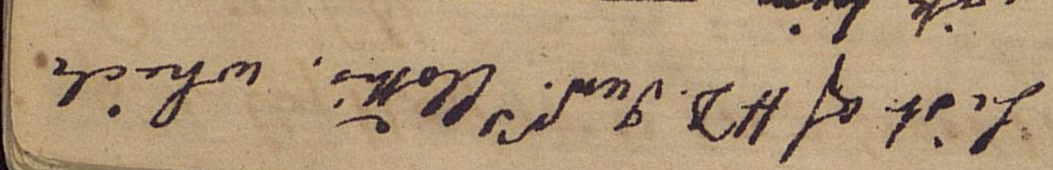List of HD. Jun^rs. Clo^ath's, which
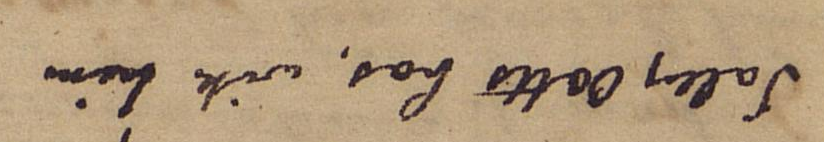Sally Oatts bas, with him
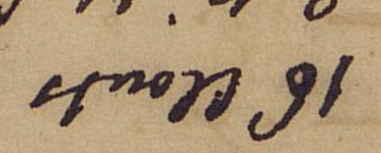16 Clouts
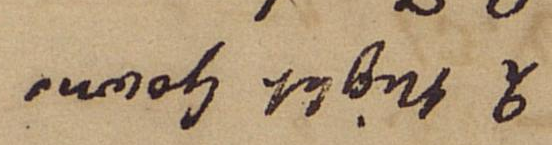2 night Gowns
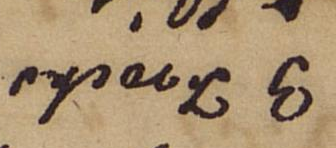3 Frocks
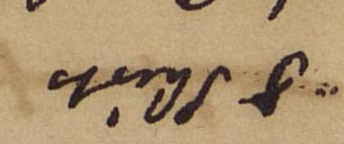8 Shirts
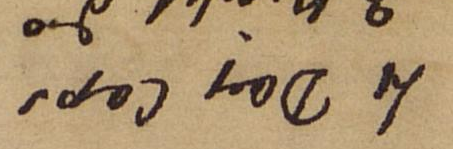4 Day Caps
